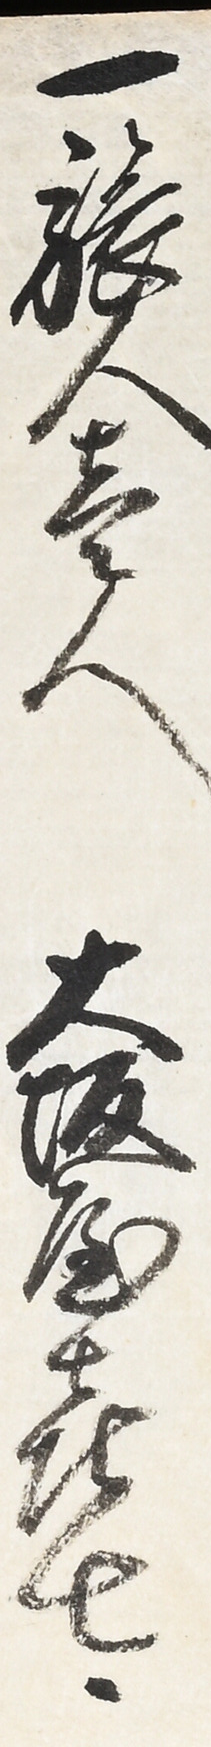一旅人壱人大坂屋喜七・
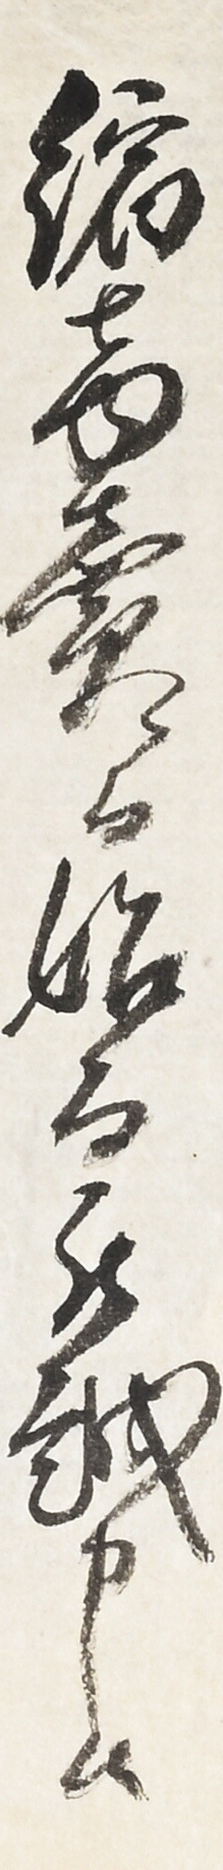縮商売ニ而始而罷越申候
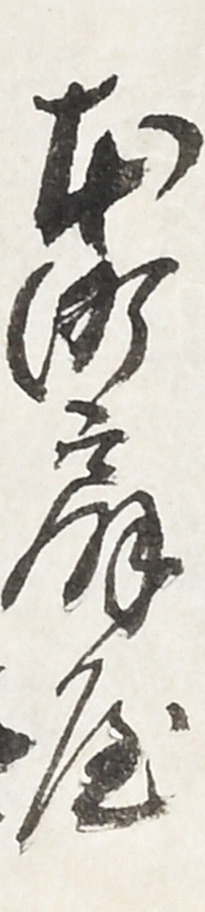本町扇屋
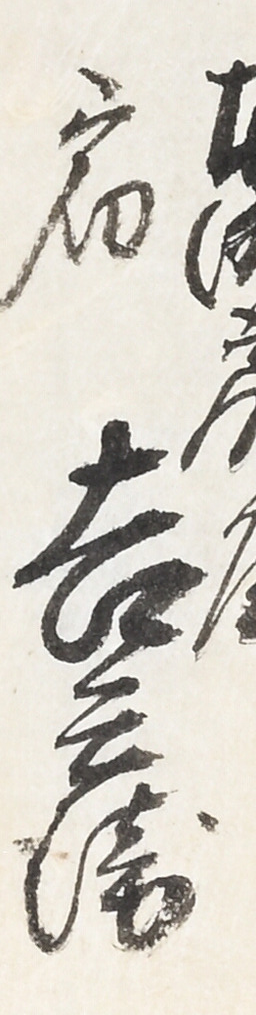宿吉兵衛
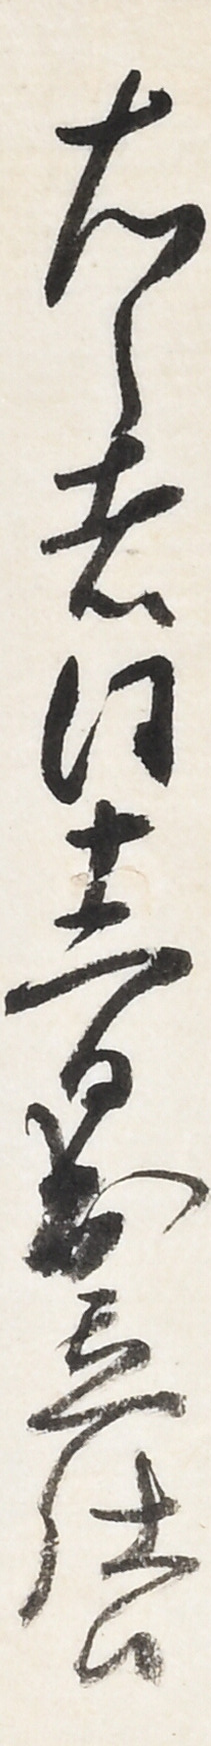右之者同十二日出立仕候
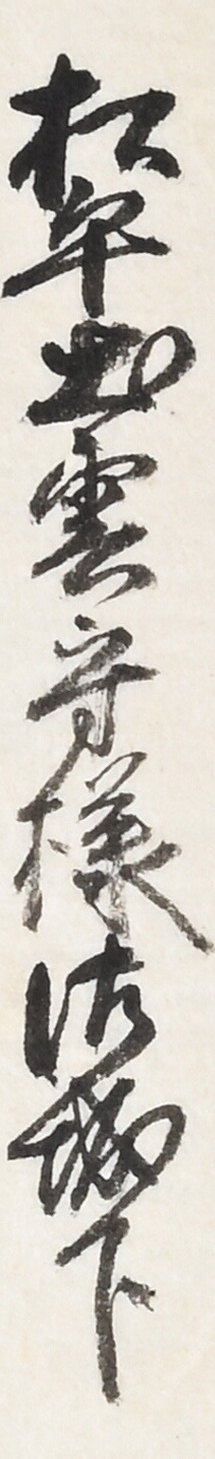松平出雲守様御城下
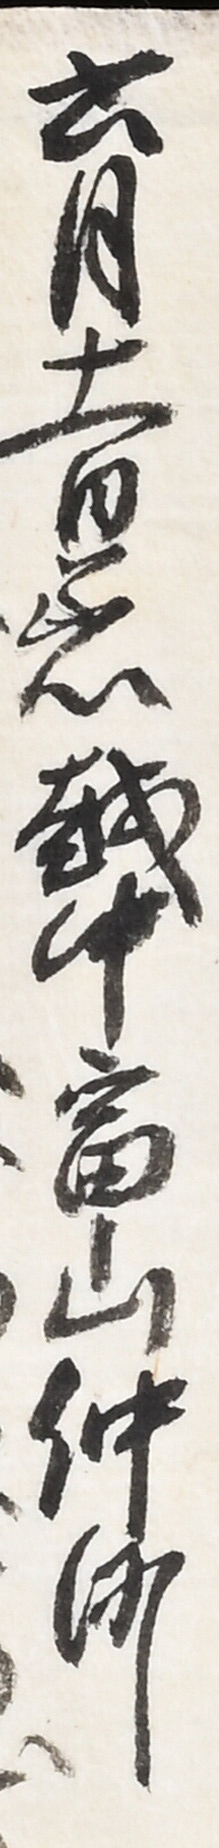六月十一日着越中冨山仲町
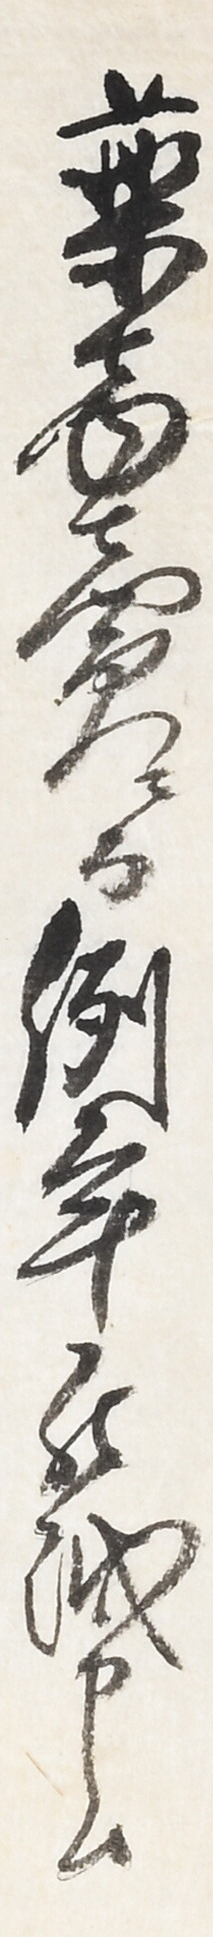薬商売ニ而例年罷越申候
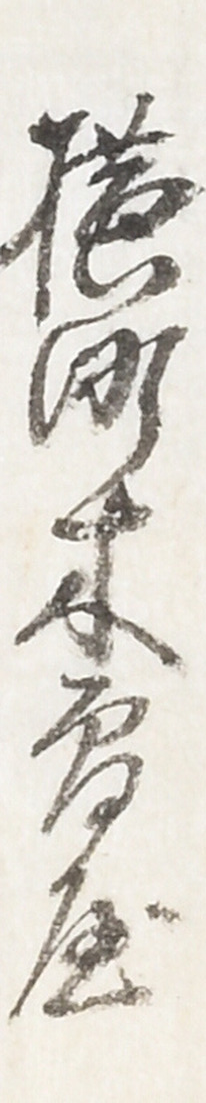横町木曽屋
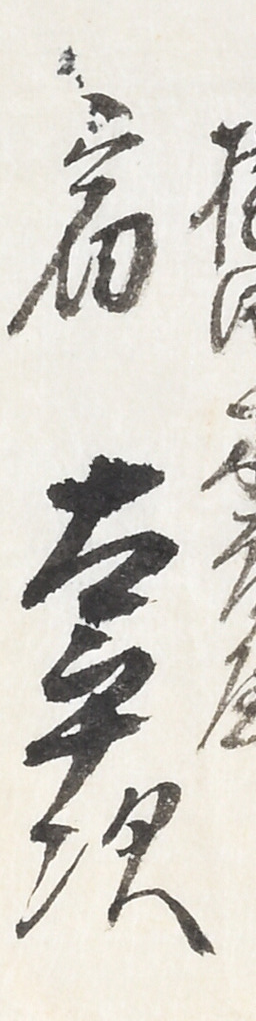宿太平次
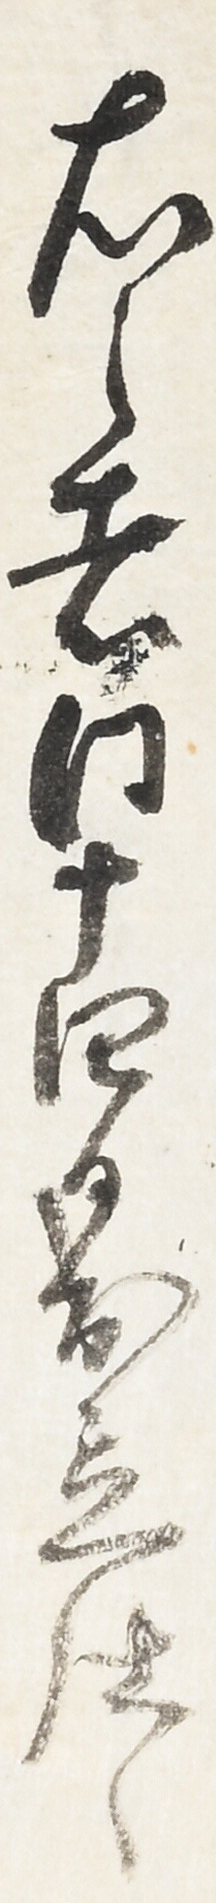右之者同十四日出立仕候
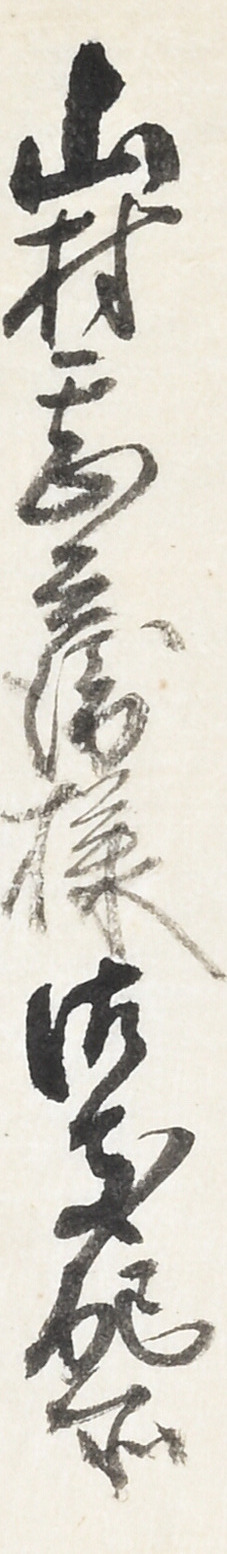山村甚兵衛様御支配所
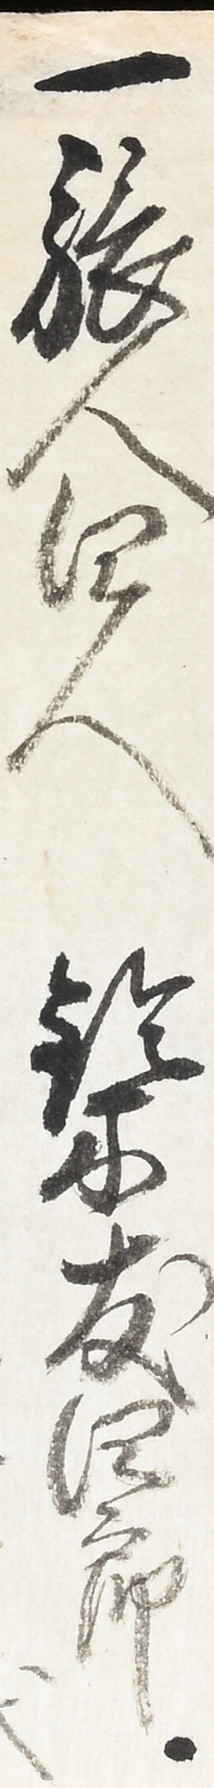一旅人四人鈴木友四郎・
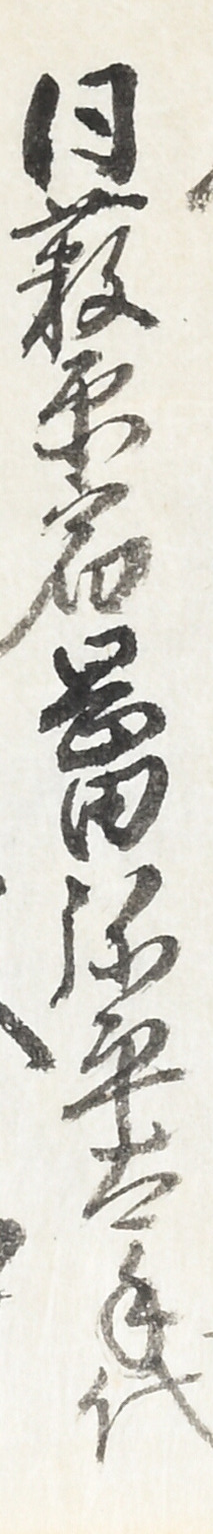同藪原宿岡田弥平太手代
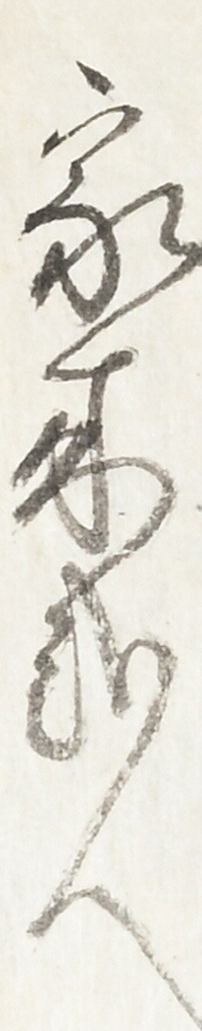家来弐人

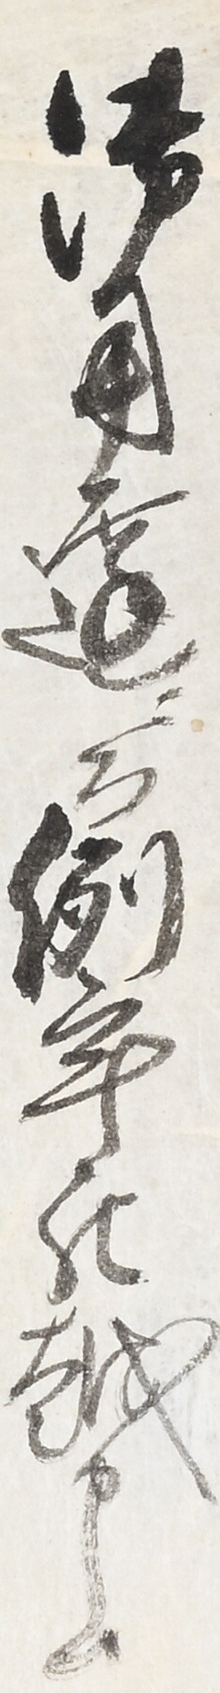御用達ニ而例年罷越申候
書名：旅人泊控帳
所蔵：伊那市立高遠町図書館・合同会社AMANE
